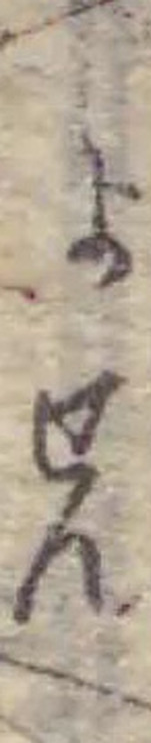よせん
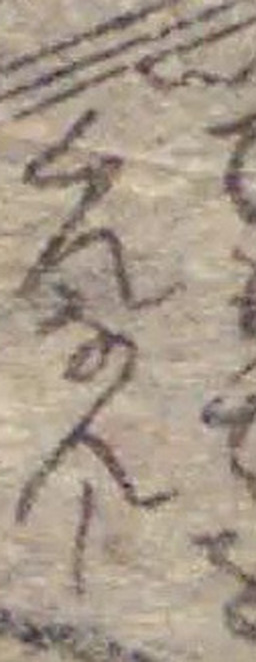くれなんし

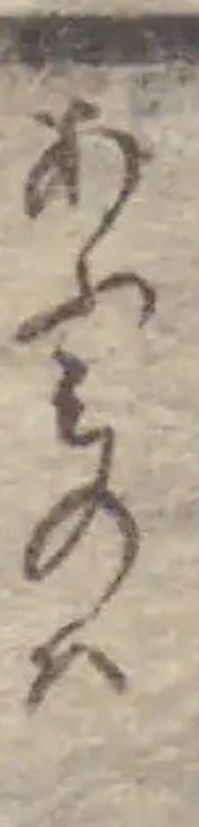あふみのは
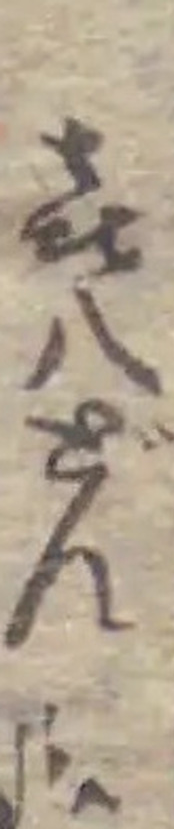喜八どん
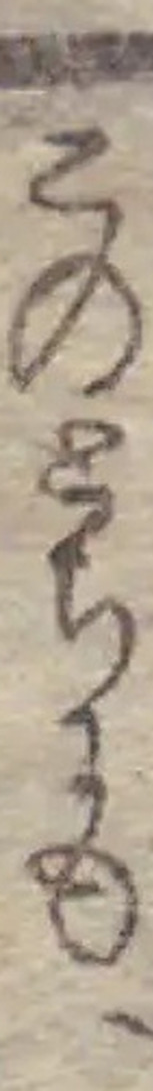このとちにも
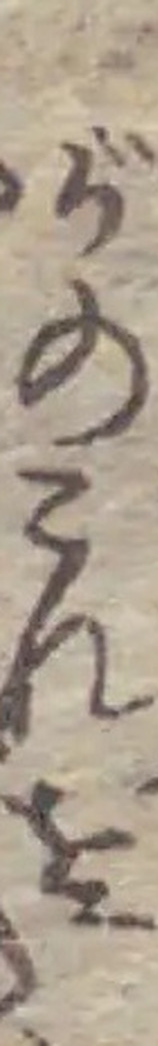がのこれを
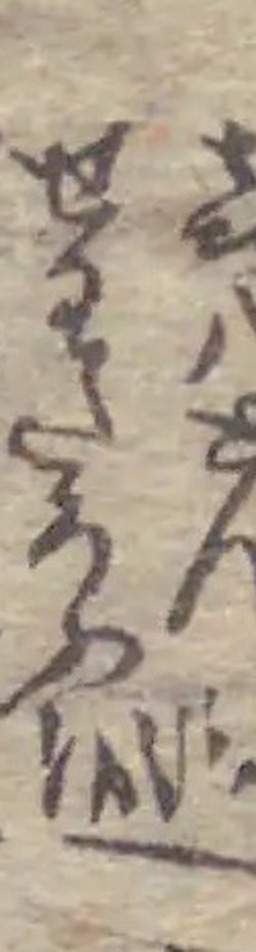せわたかふ
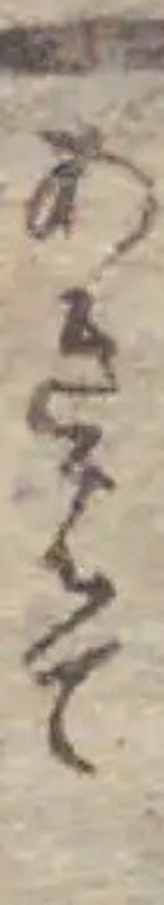あきはて
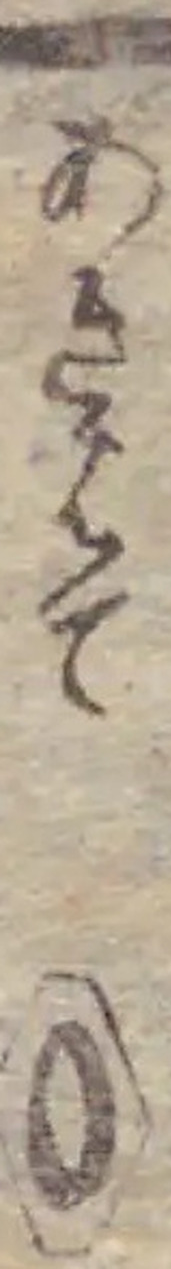あきはて
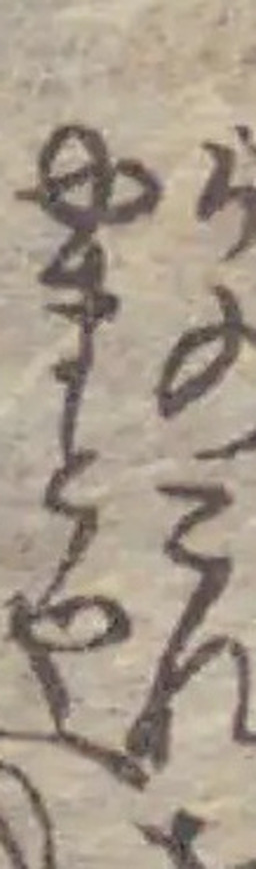やまとやへ
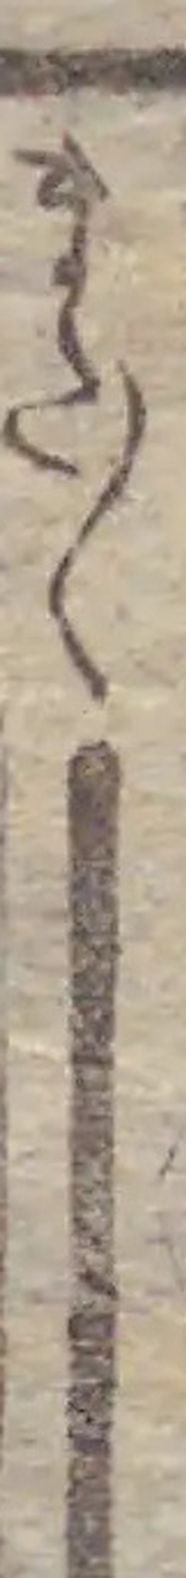また〳〵
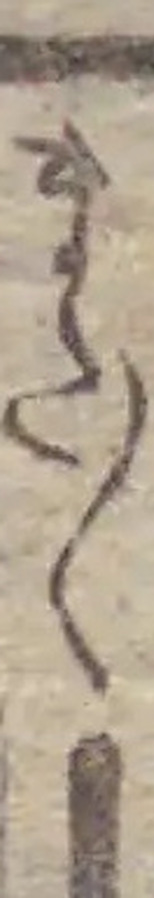また〳〵
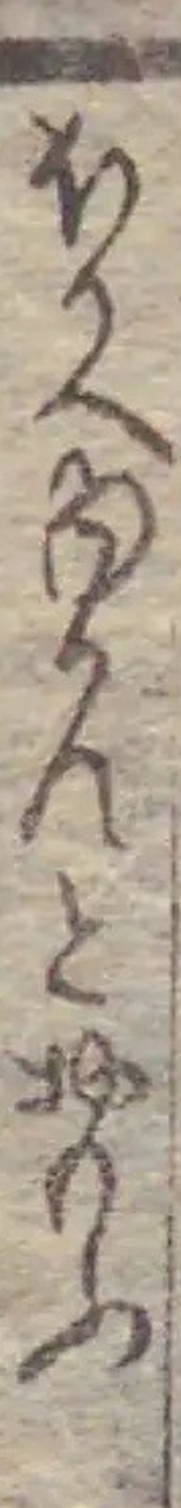ほかへゆかんとおもふ
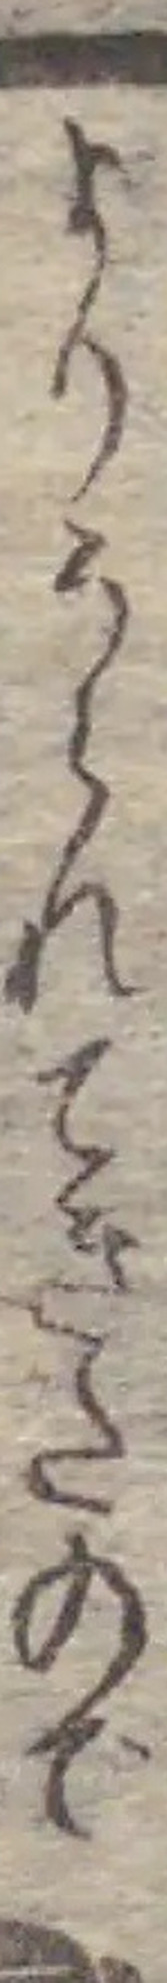よりうられてきたので
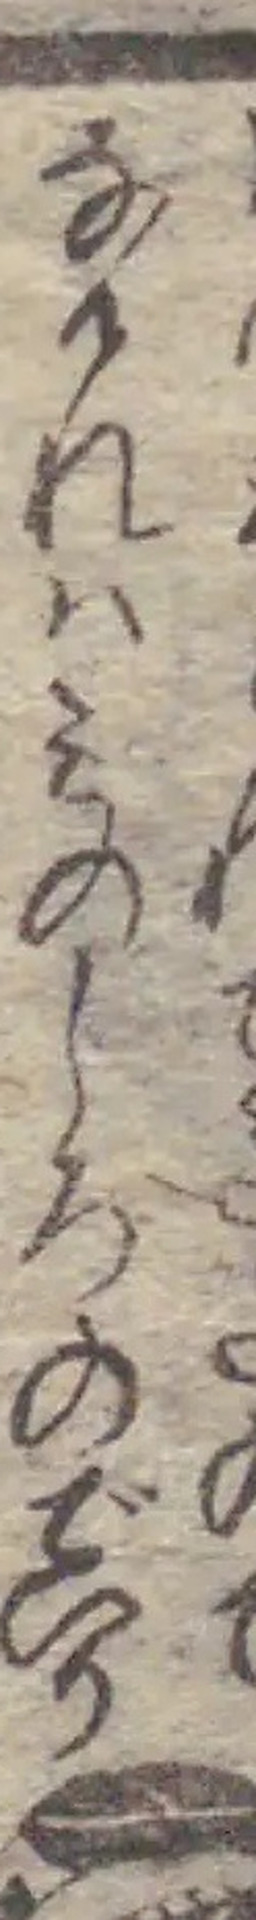なけれはみのしろのでいり
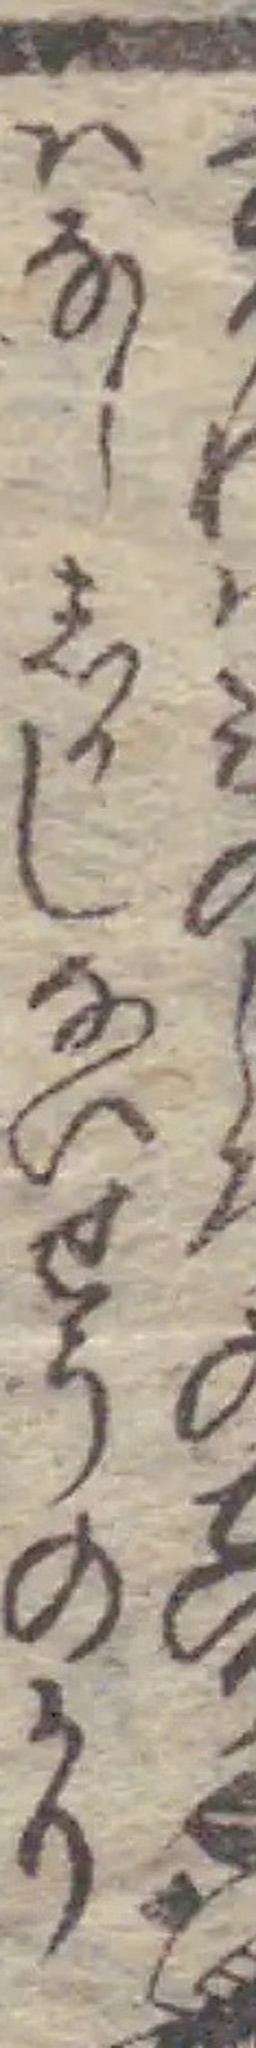はなししかしないせうのかり
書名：かんなんの夢枕 2巻
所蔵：国立国会図書館 National Diet Library, JAPAN
